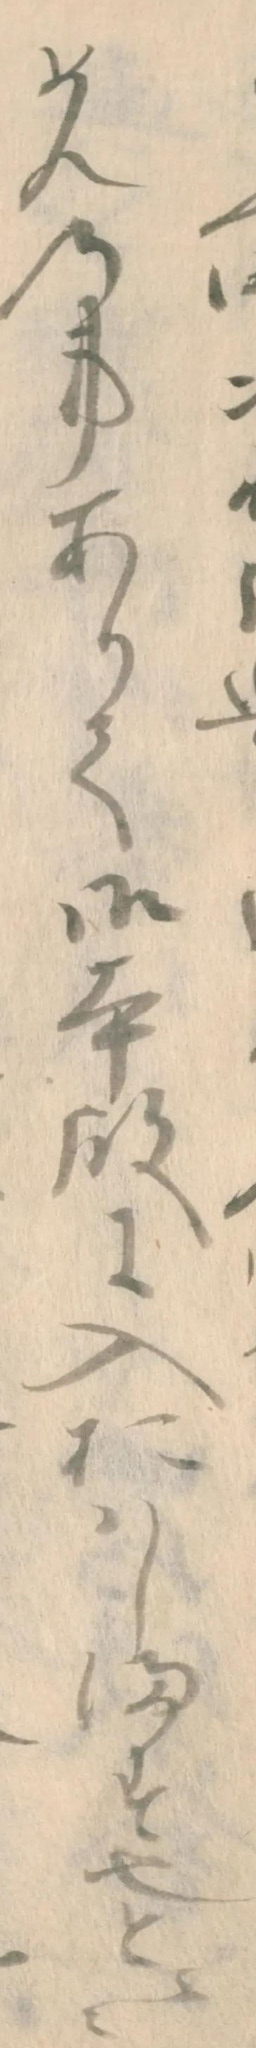めんの事ありて御本殿に入おはします也と云々
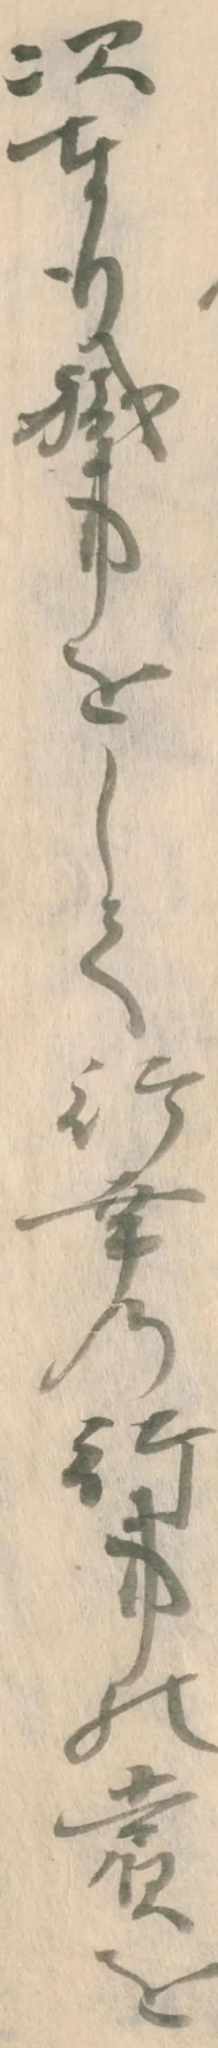次奉行職事をして行幸の行事の賞を
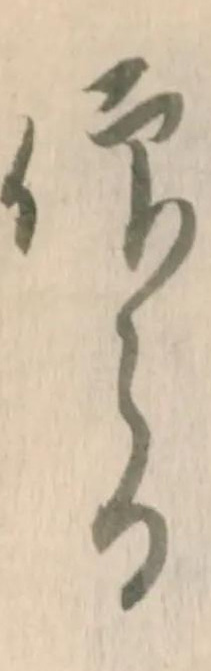仰らる
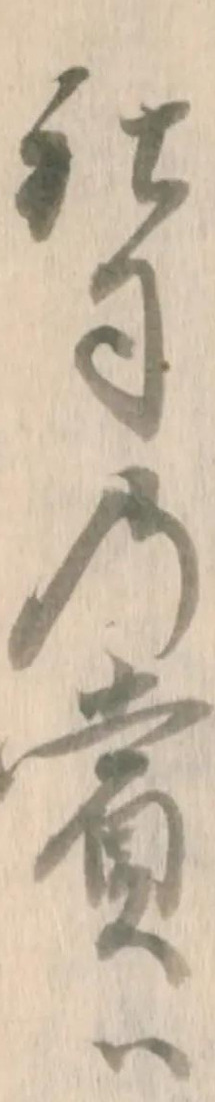社司の賞は
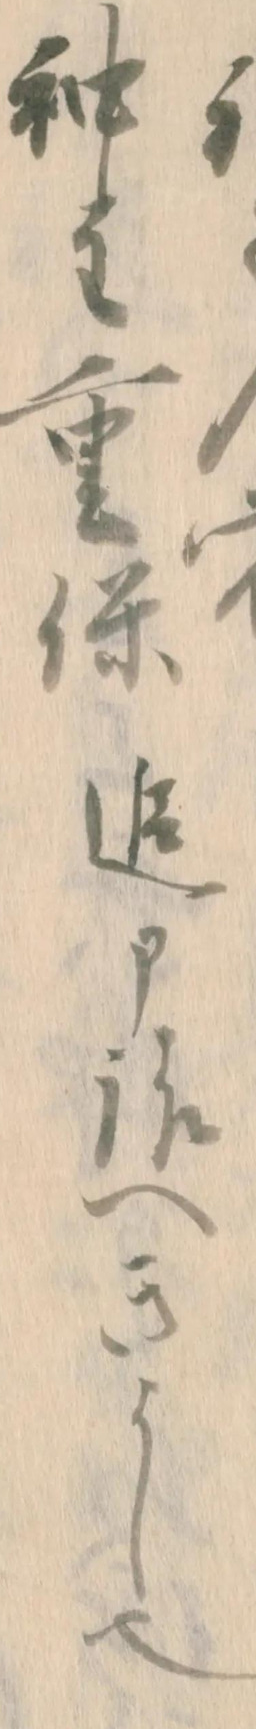神主重保追申請へきよし也
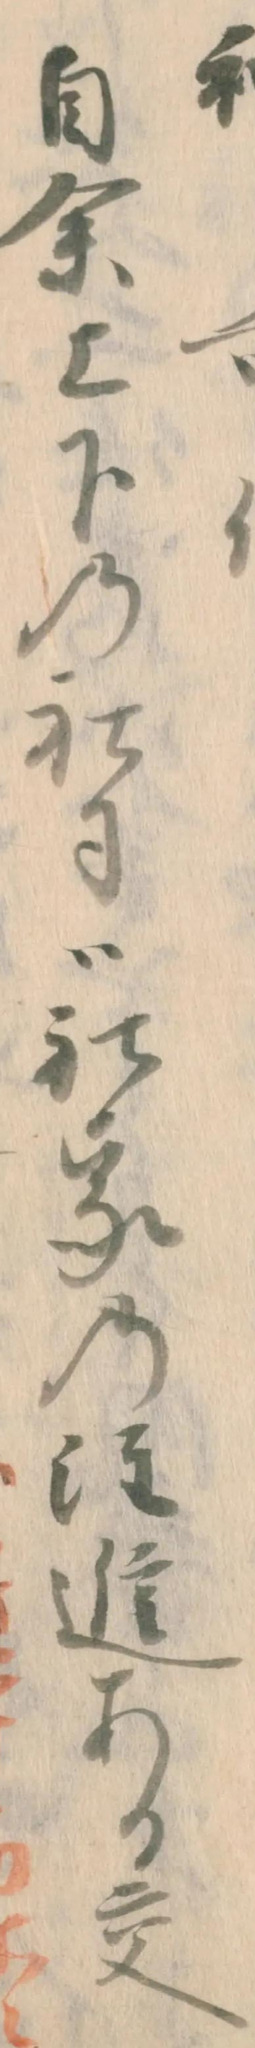自余上下の社司は社家の注進ある交
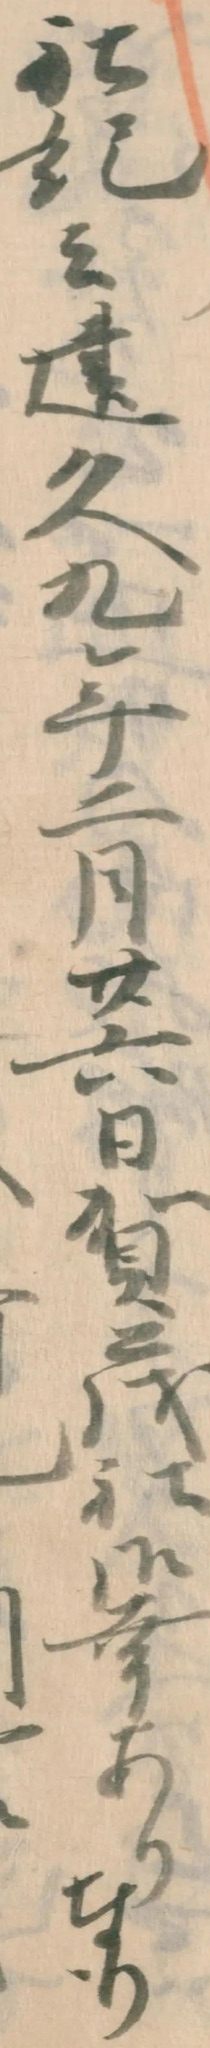社記云建久九年二月廿六日賀茂社御幸あり奉行
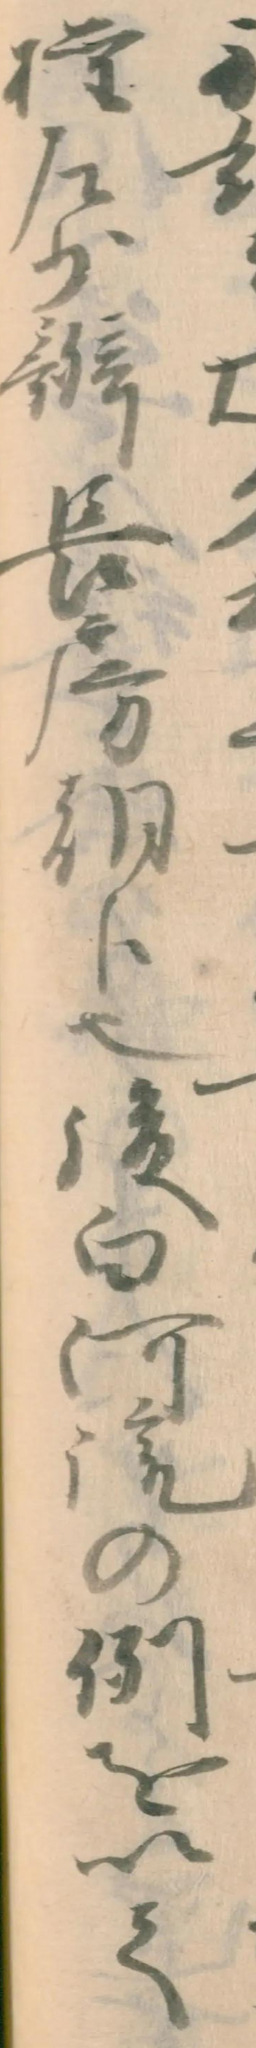権左少弁長房朝臣也後白河院の例を以て
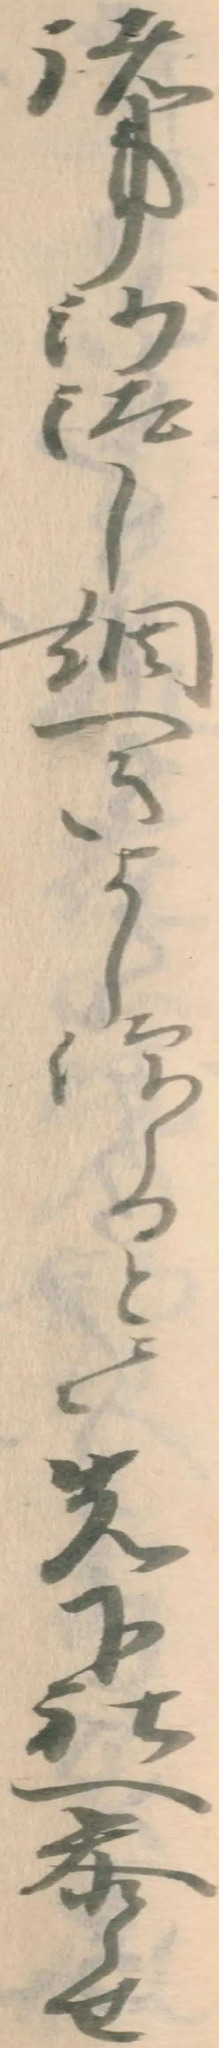諸事沙汰し調へきよし仰らると云々先下社へ参らせ
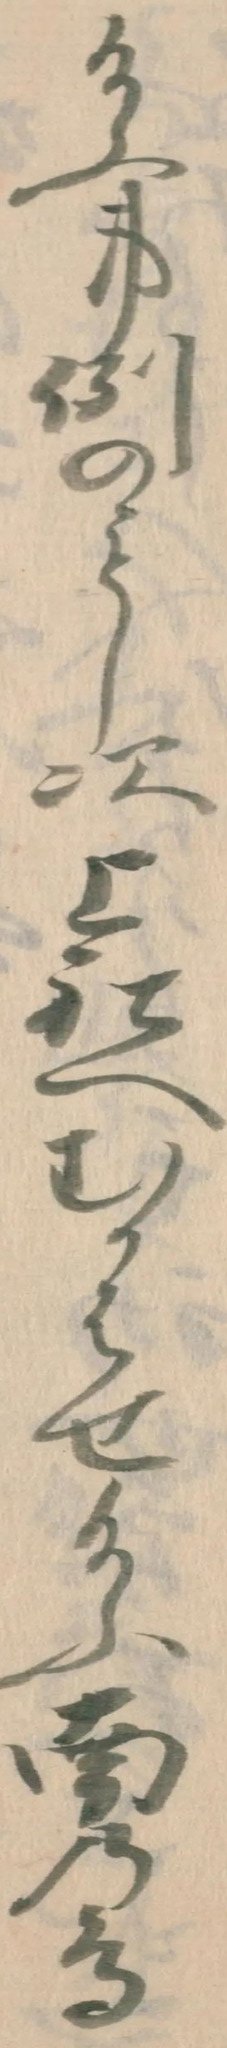給ふ事例のことし次上社へむかはせ給ふ南の鳥
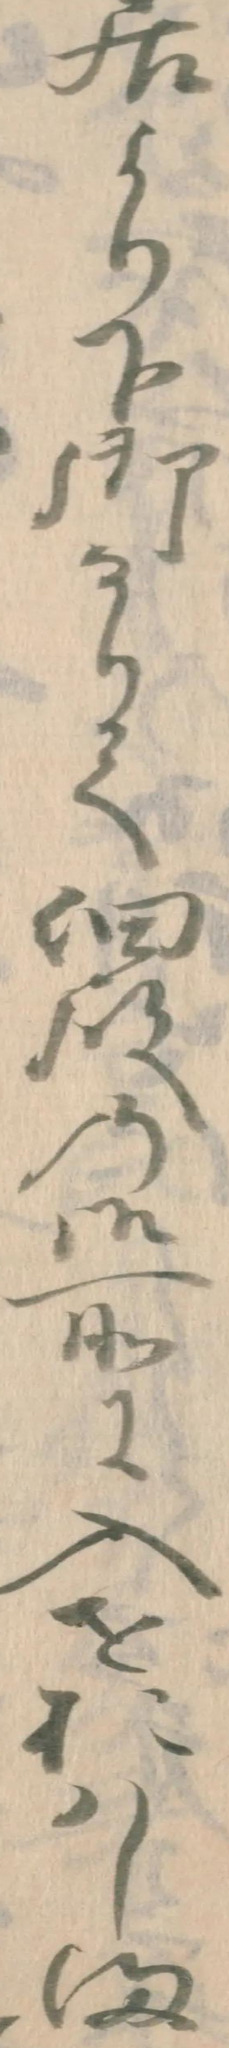居より下御なりて細殿の御所に入せおはします
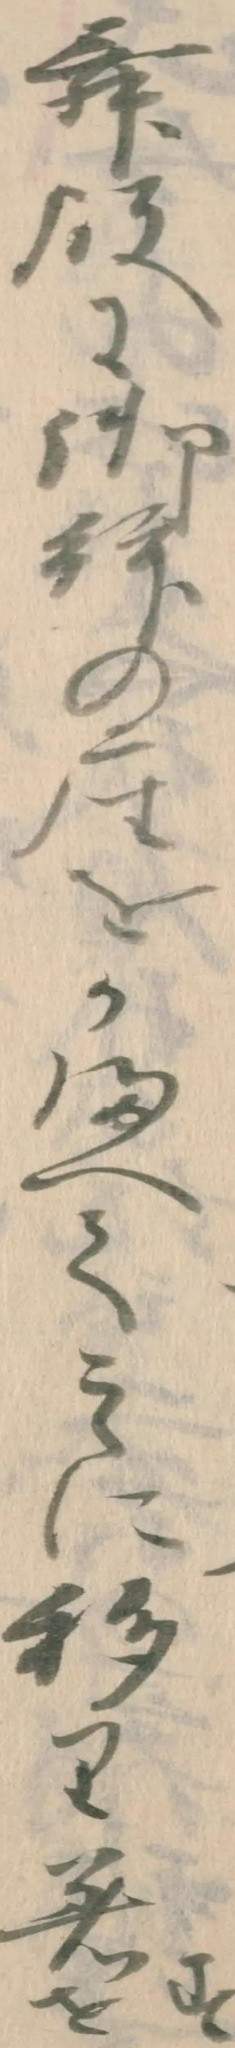舞殿に御拝の座をかまへてこゝに移り着せ
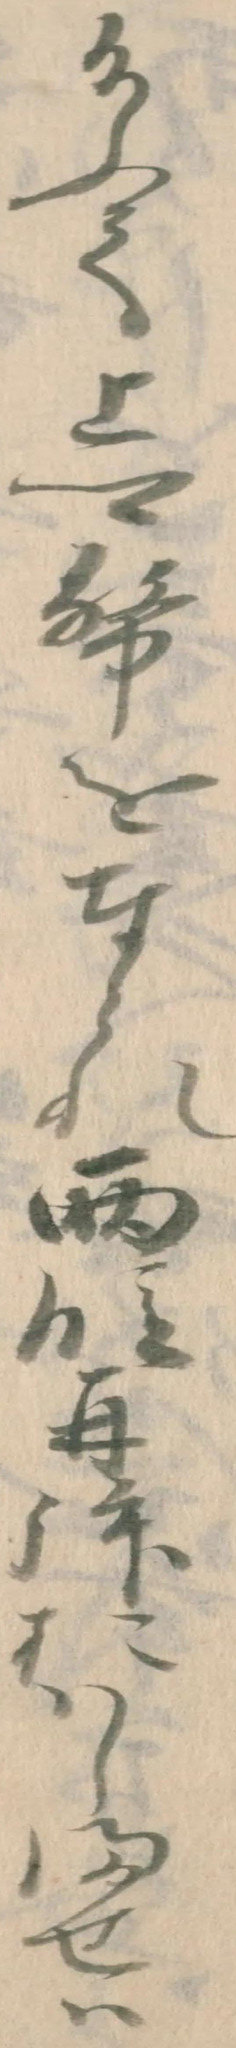給ふて上卿幣を奉られ両段再拝おはしませは
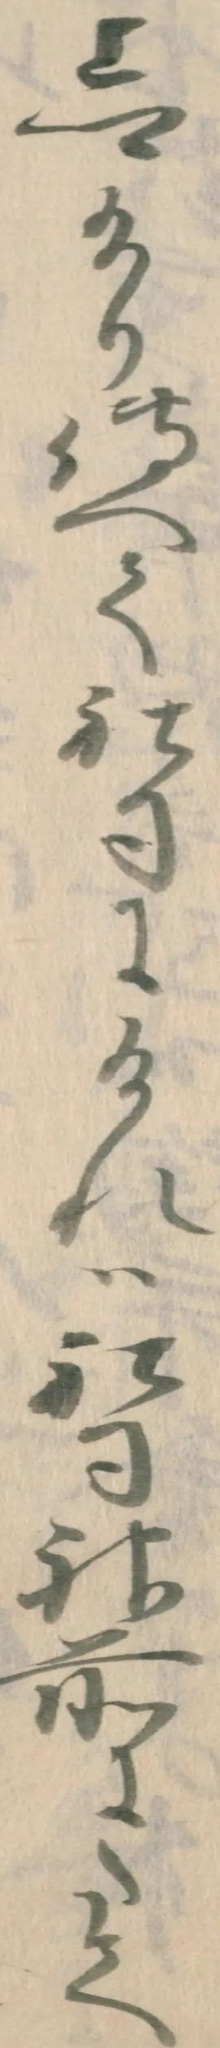上卿給り伝へて社司に給れは社司神前にたて
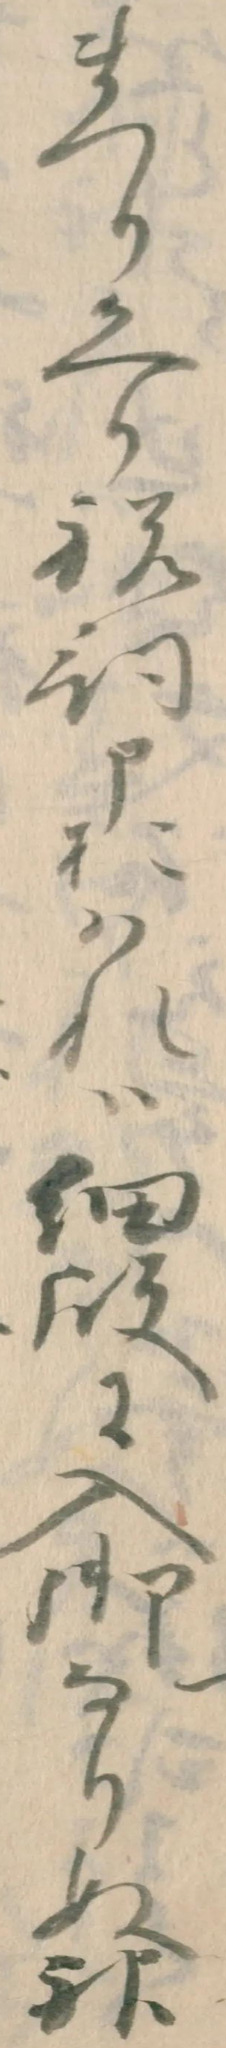まつりかへり祝詞申おはれは細殿に入御なりぬ神
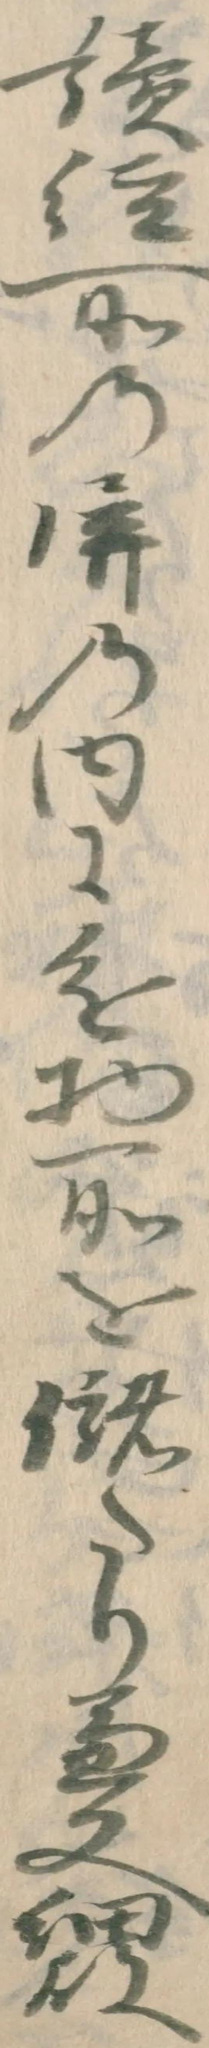続経所の屏の内に進物所を儲たり兼又細殿
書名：賀茂社記録. 第1冊
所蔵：国立国会図書館 National Diet Library, JAPAN
